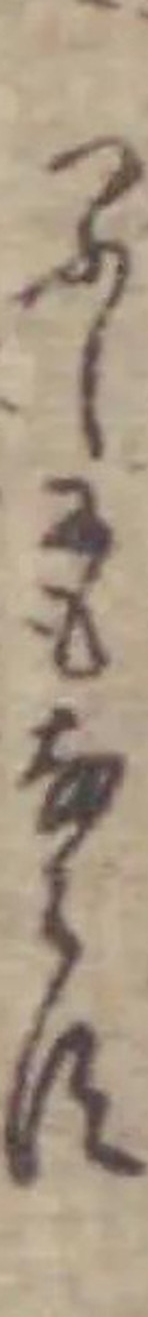つぶしにもならす
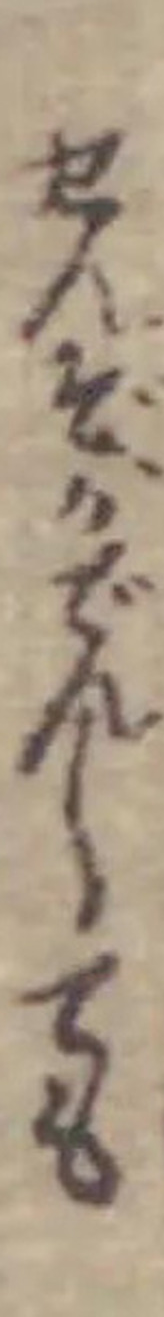せんぞがでんしても
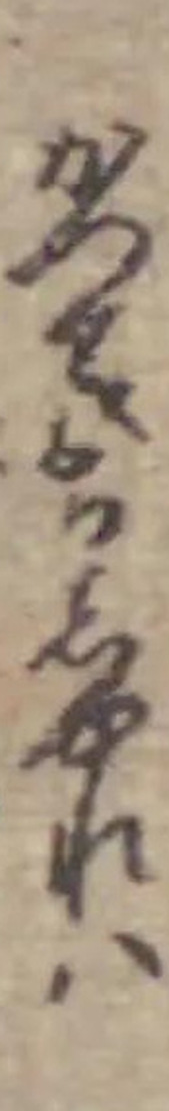かつておかしやれは
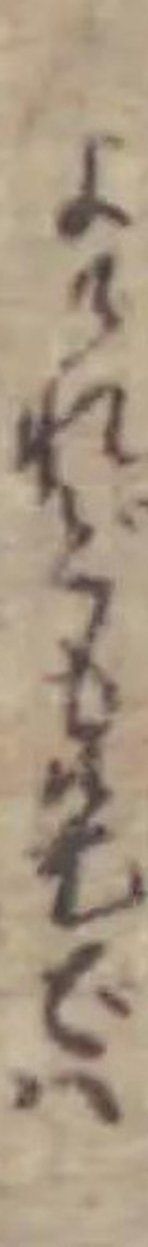よけれども是では
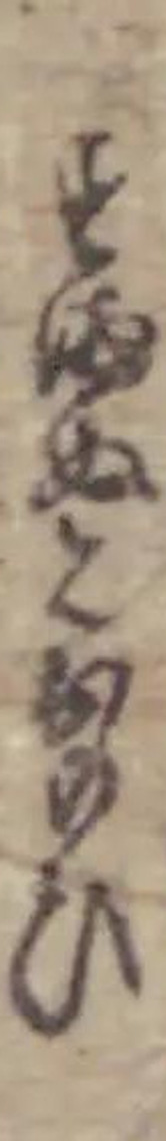すまぬとおもひ
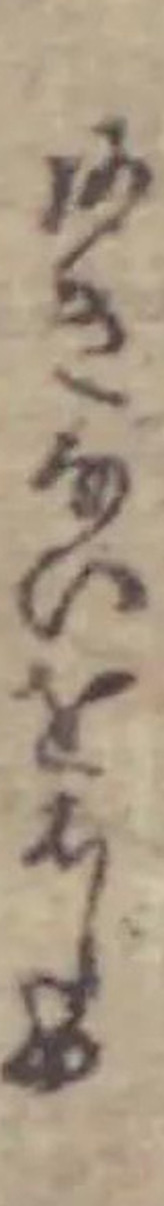あきないをはしめ
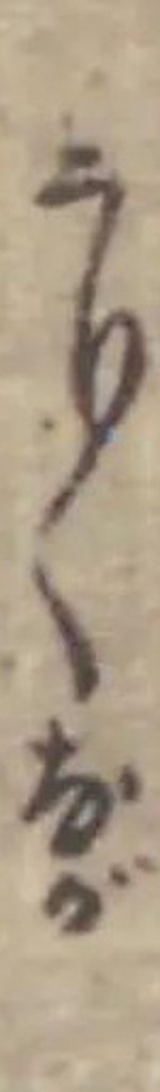うり〳〵なが
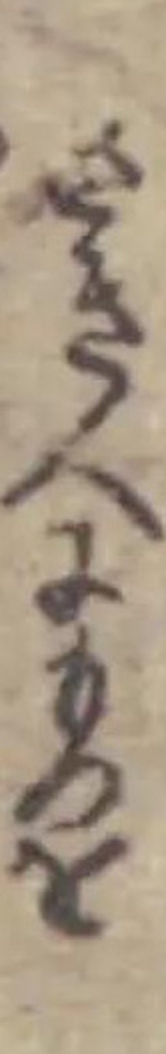さきへにもつを
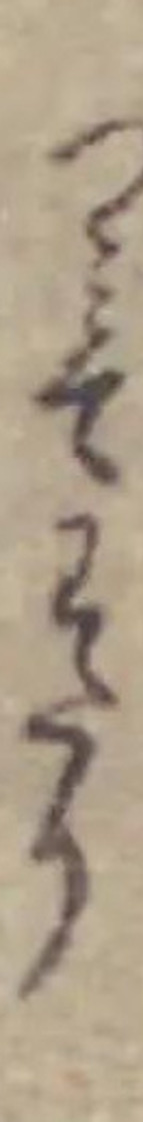つみてわたり
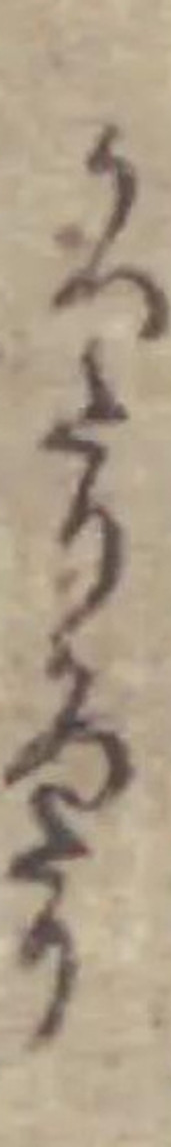うつたりかつたり
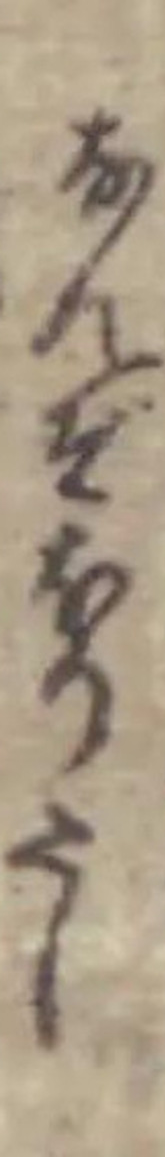なんぞほりたし
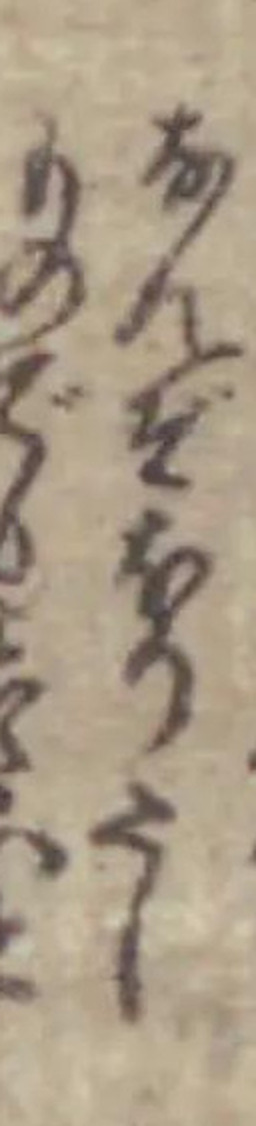ものでもしたいと
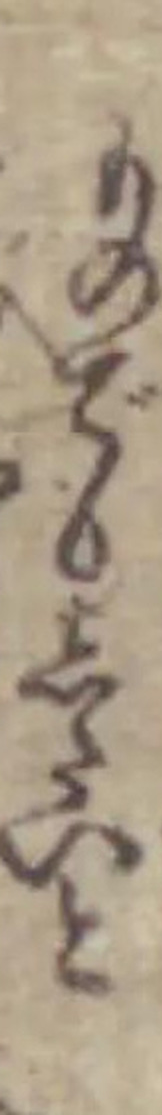ものでもしたいと
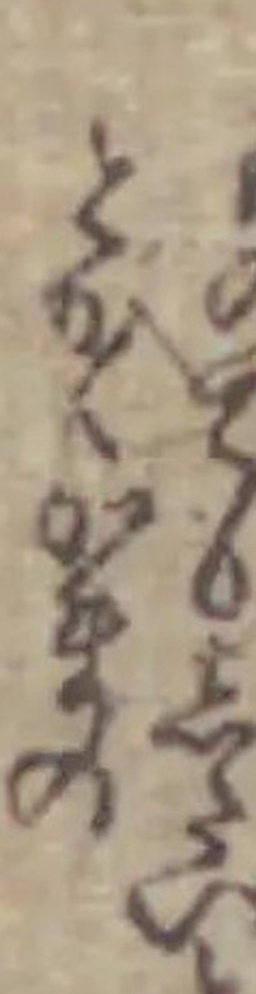とかくかまの
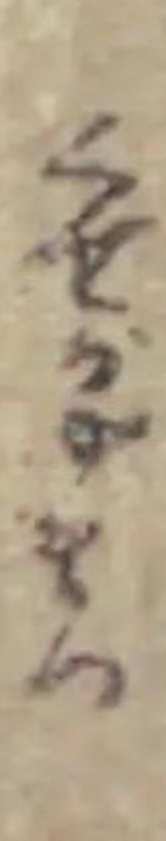くせかやまつ
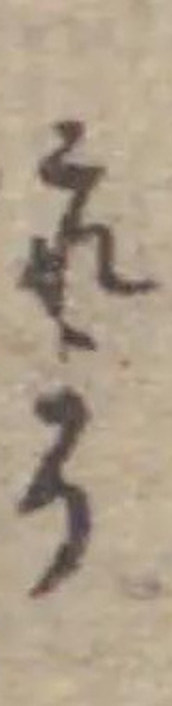これより
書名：間違月夜鍋 2巻
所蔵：国立国会図書館 National Diet Library, JAPAN
